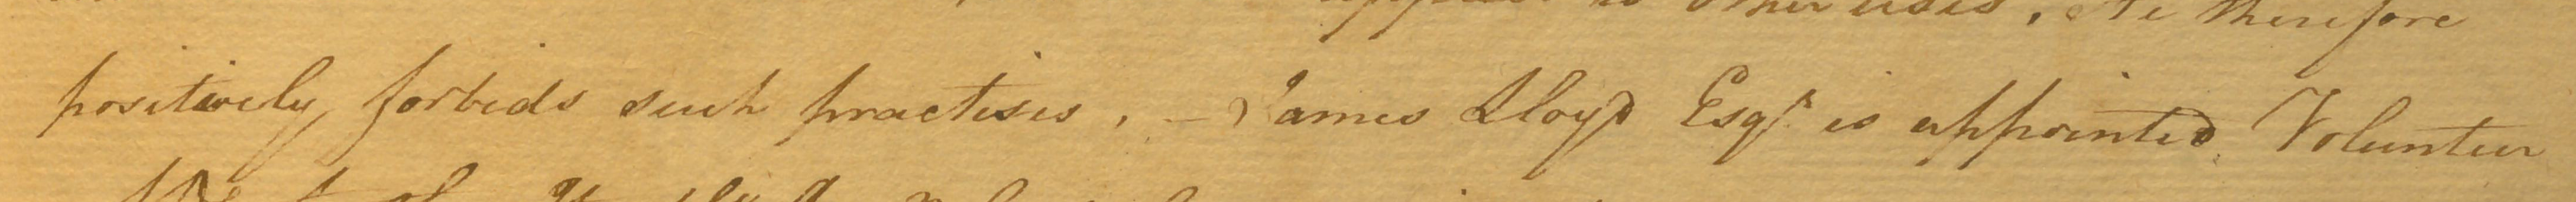positively forbids such practices.- James Lloyd Esq^r is appointed Volunteer
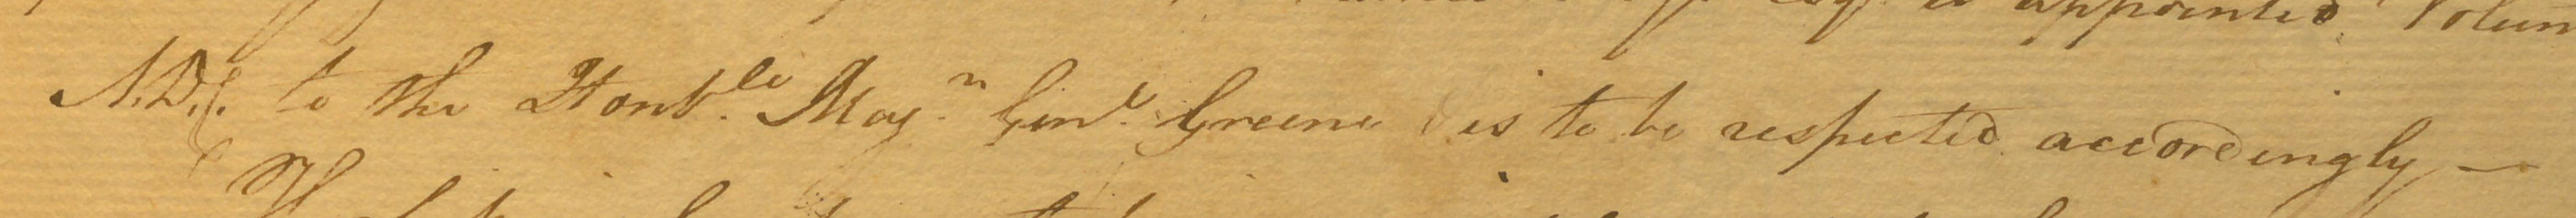A.D.C. to the Honb^le Maj^r. Gen^l. Greene is to be respected accordingly-
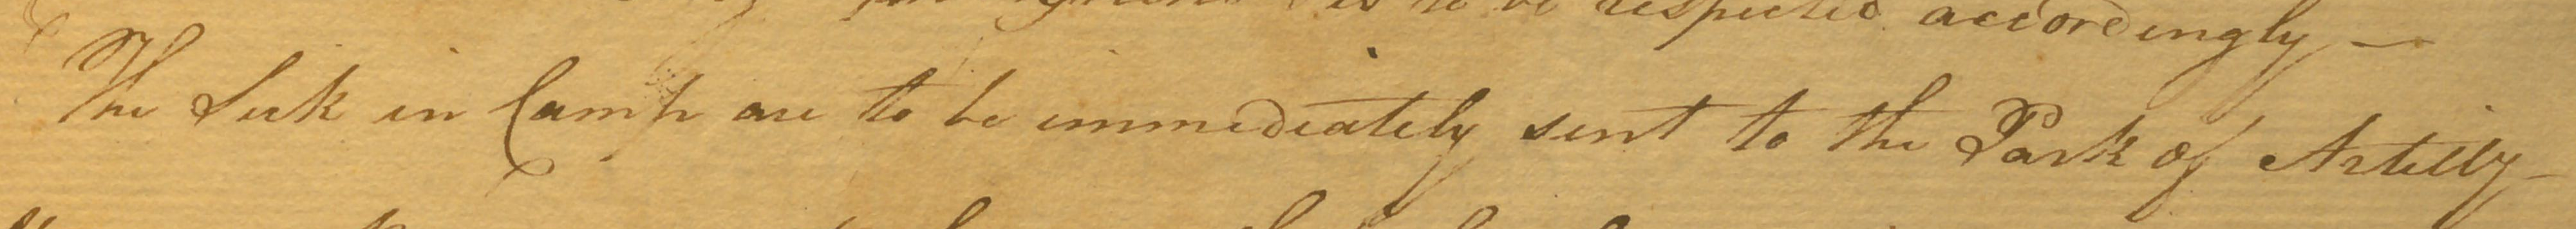The Sick in Camp are to be immediately sent to the Park of Artill^y-
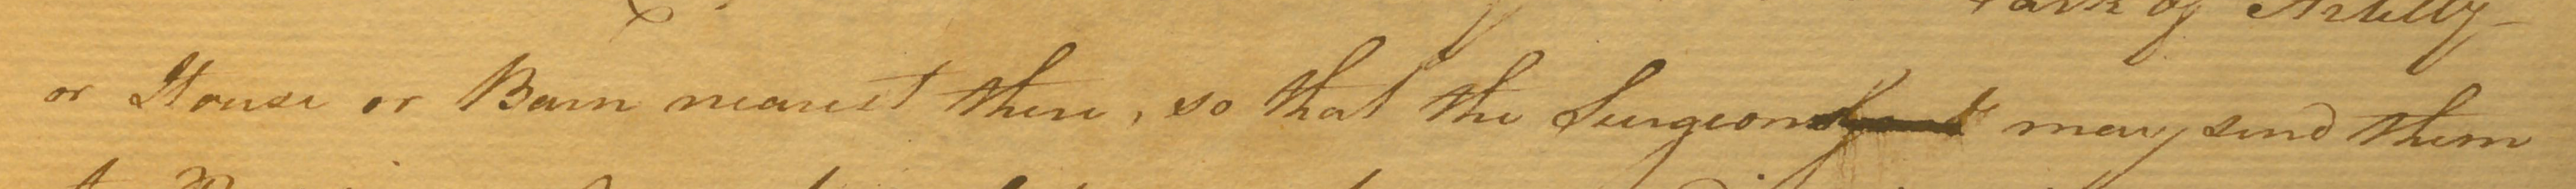or House or Barn nearest there, so that the Surgeon [____] may send them
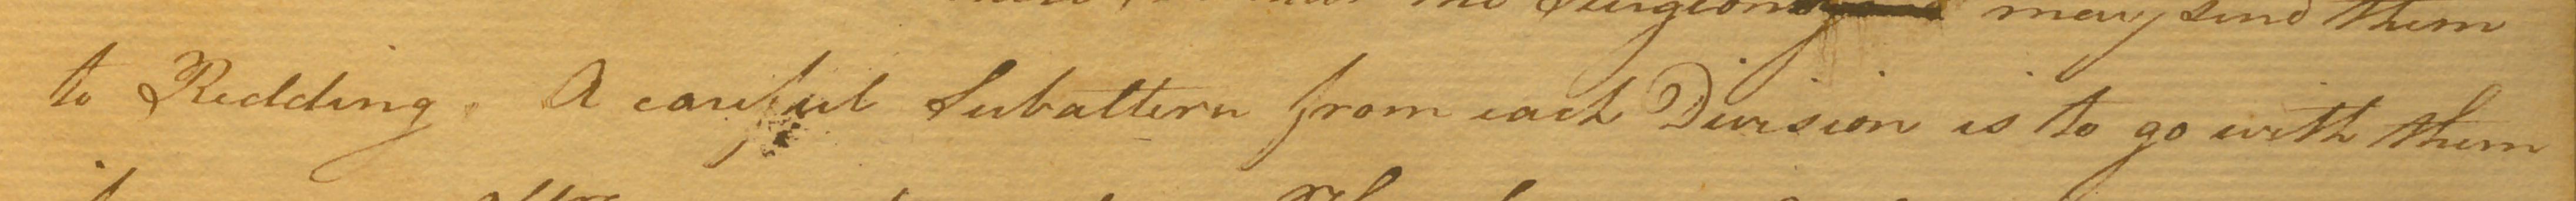to Redding. A careful Subaltern from each Division is to go with them
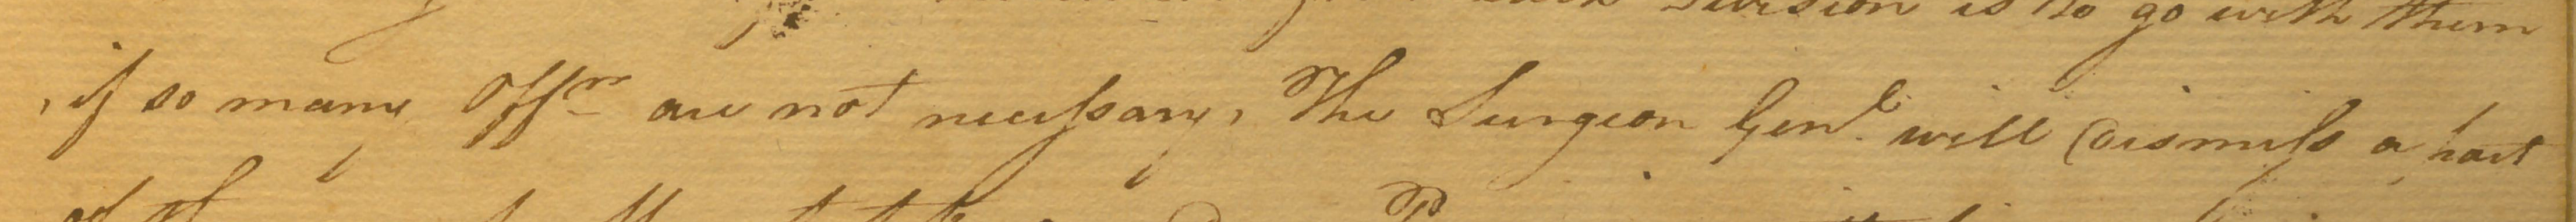if so many Off^rs are not necessary, The Surgeon Gen^l. will dismiss a part
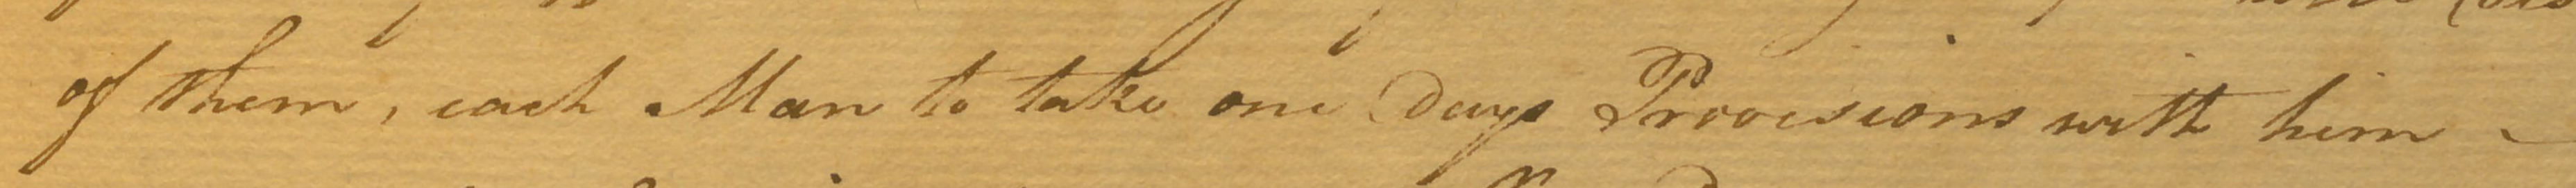of them, each Man to take one days Provisions with him-
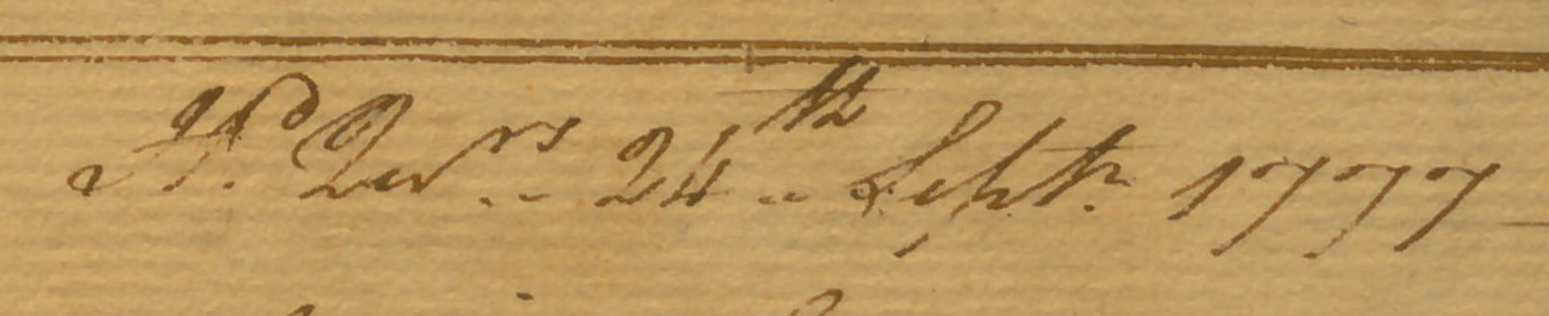H^d. Qu^rs. 24^th. Sept^r. 1777
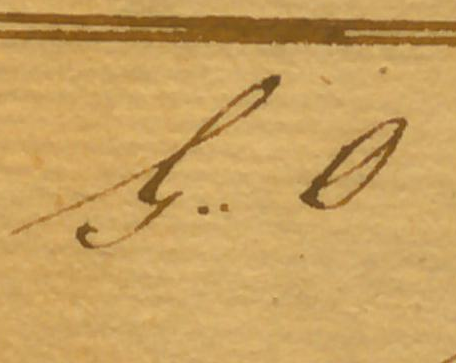G. O
